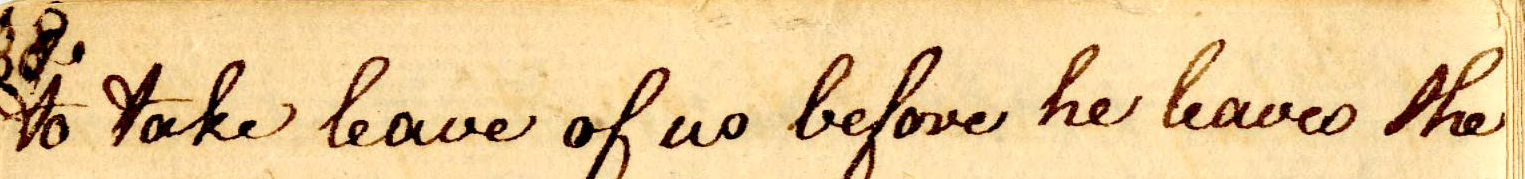to take leave of us before he leaves the
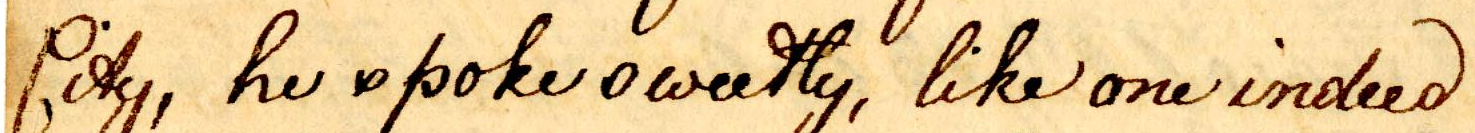City, he spoke sweetly, like one indeed
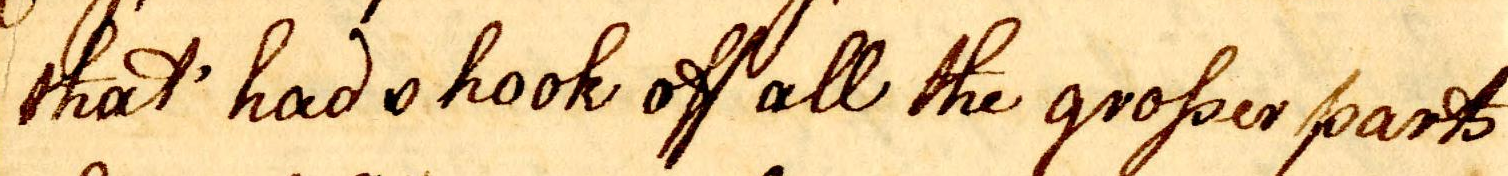that had shook off all the grosser parts
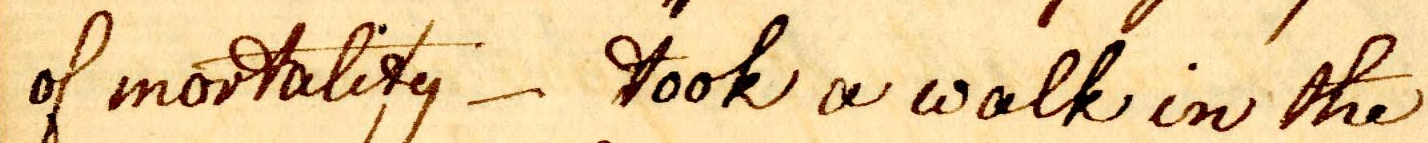of mortality- took a walk in the
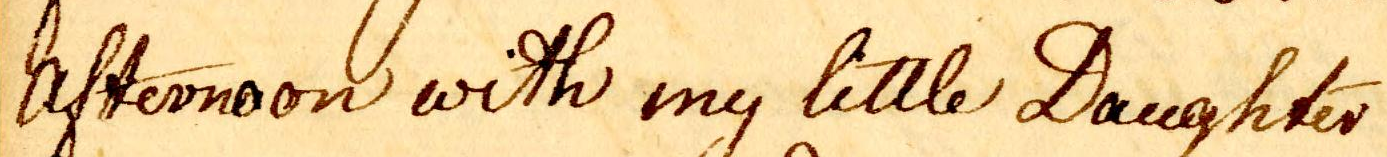Afternoon with my little Daughter
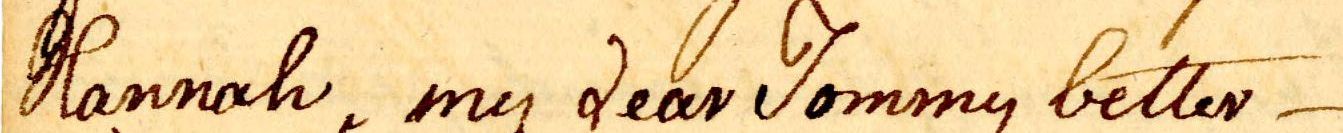Hannah, my dear Tommy better
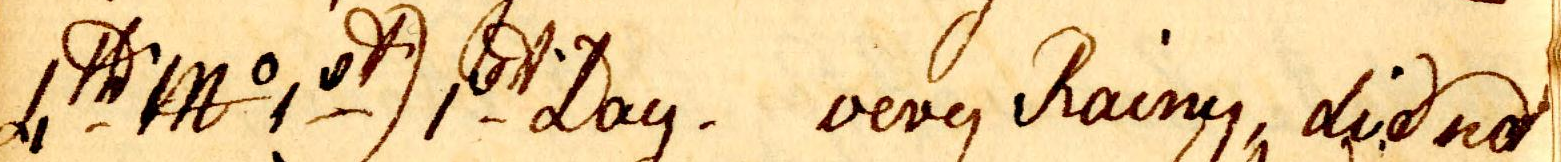4^th M^o 1^st) 1^st Day- very Rainy did not
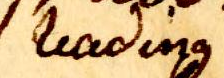reading
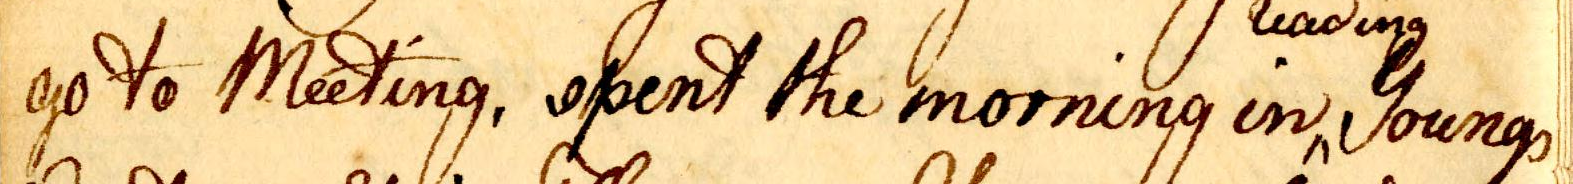go to meeting spent the morning in ^ Youngs
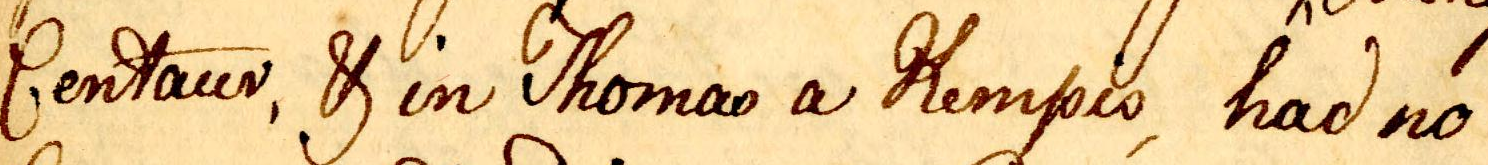Centaur, & in Thomas a Kempis, had no
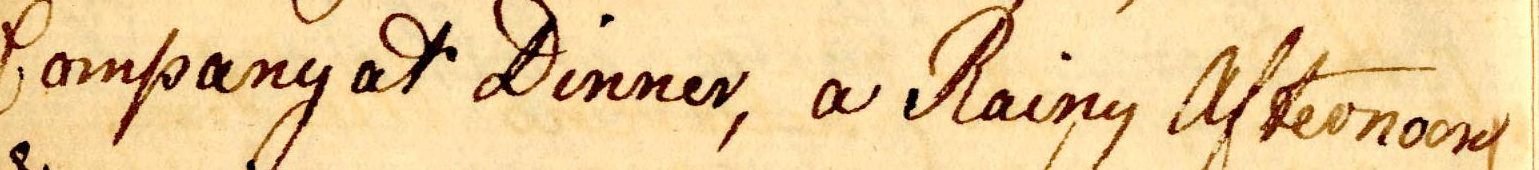Company at Dinner, a Rainy Afternoon
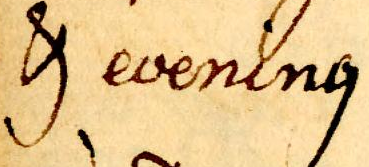& evening
